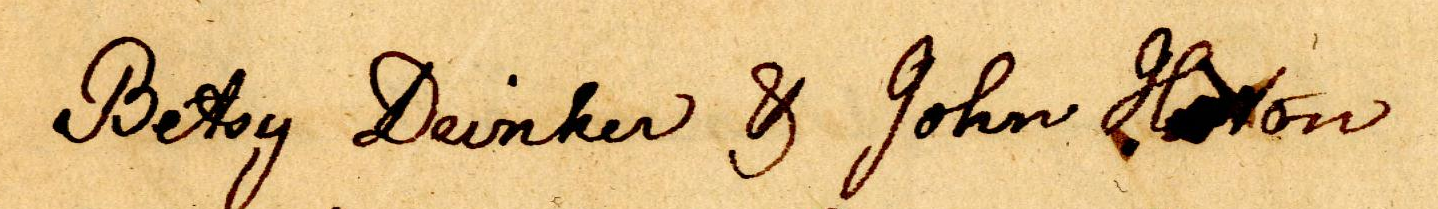Betsy Drinker & John H[_]ton
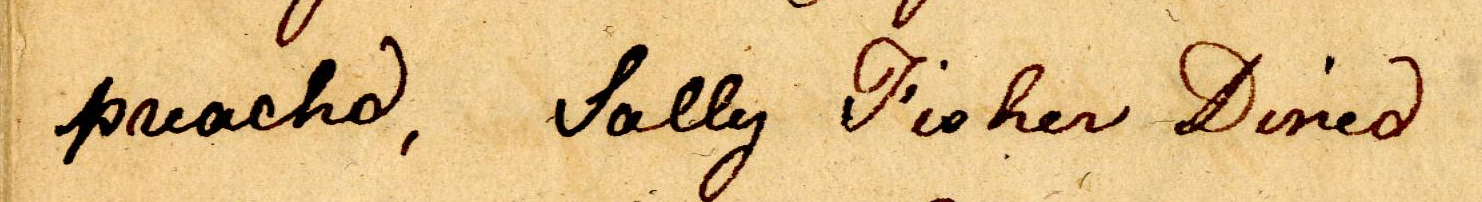preachd, Sally Fisher Dined
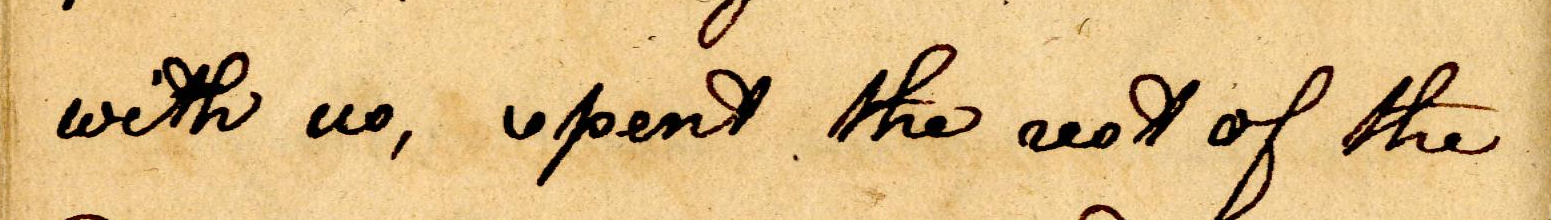with us, spent the rest of the
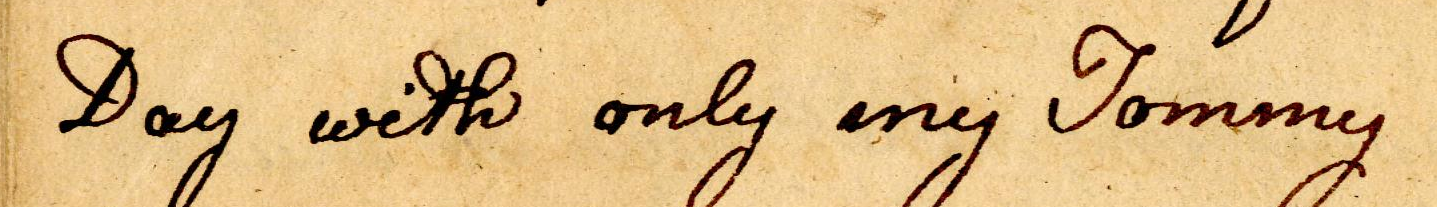Day with only my Tommy
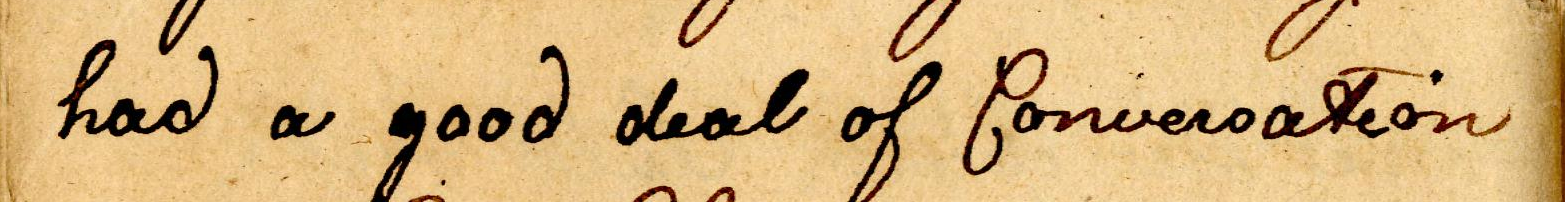had a good deal of Conversation
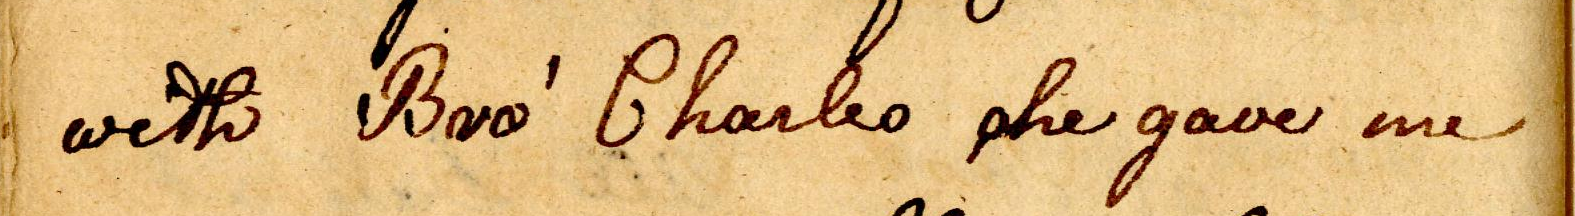with Bro' Charles she gave me
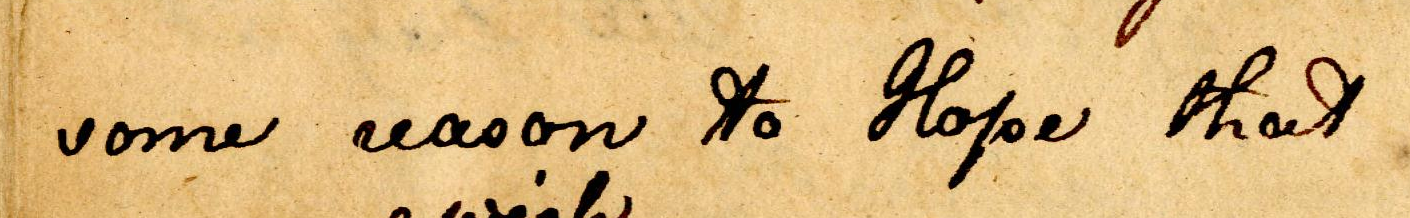some reason to Hope that
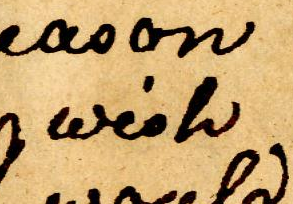wish
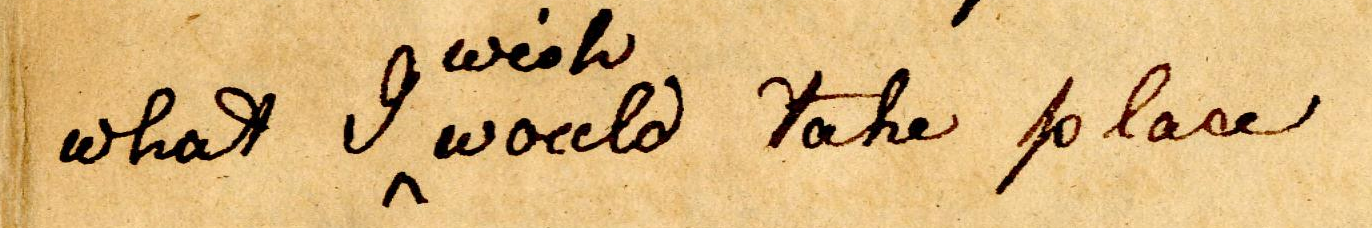what I ^ would take place
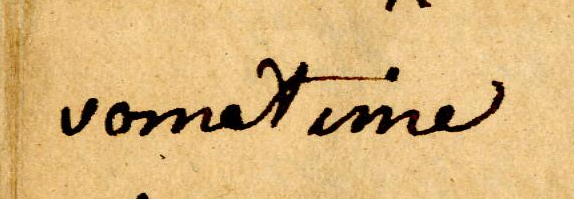sometime
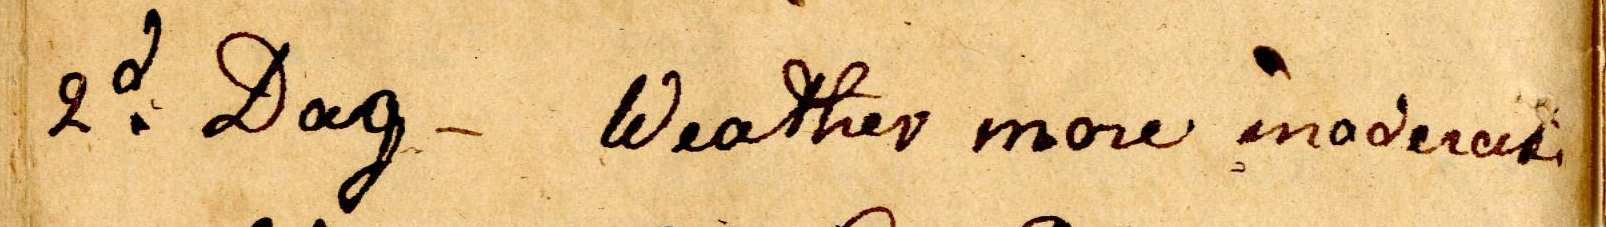2^d. Day- Weather more modereit
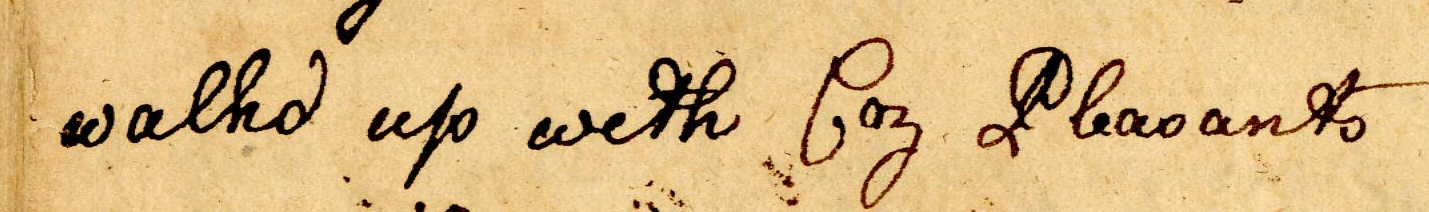walkd up with Coz Pleasants
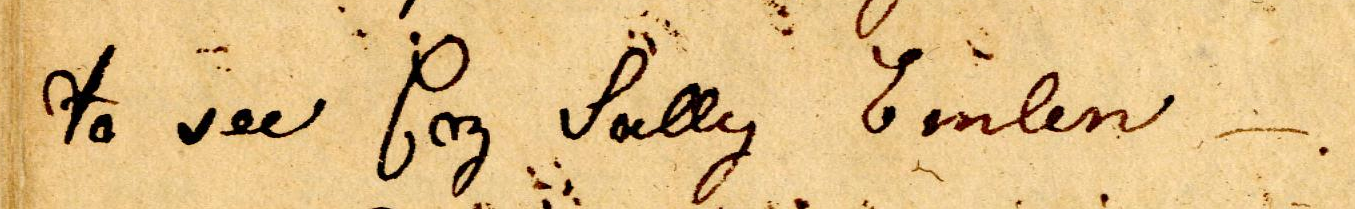to see Coz Sally Emlen -
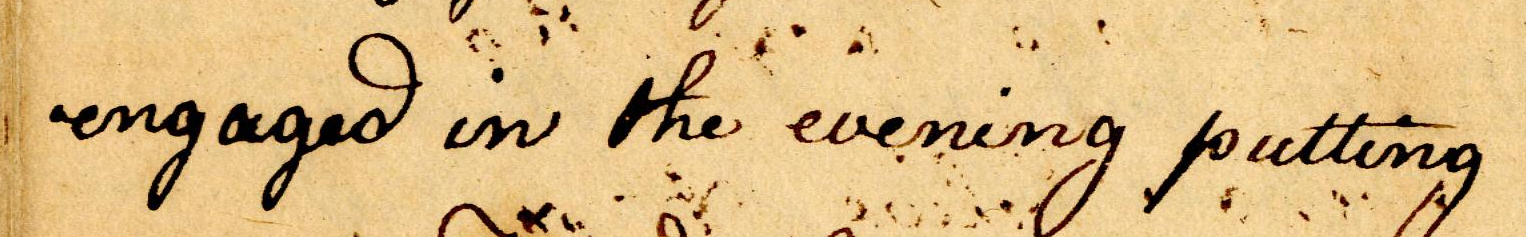engaged in the evening putting
